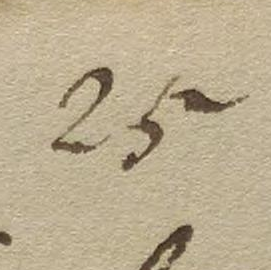25
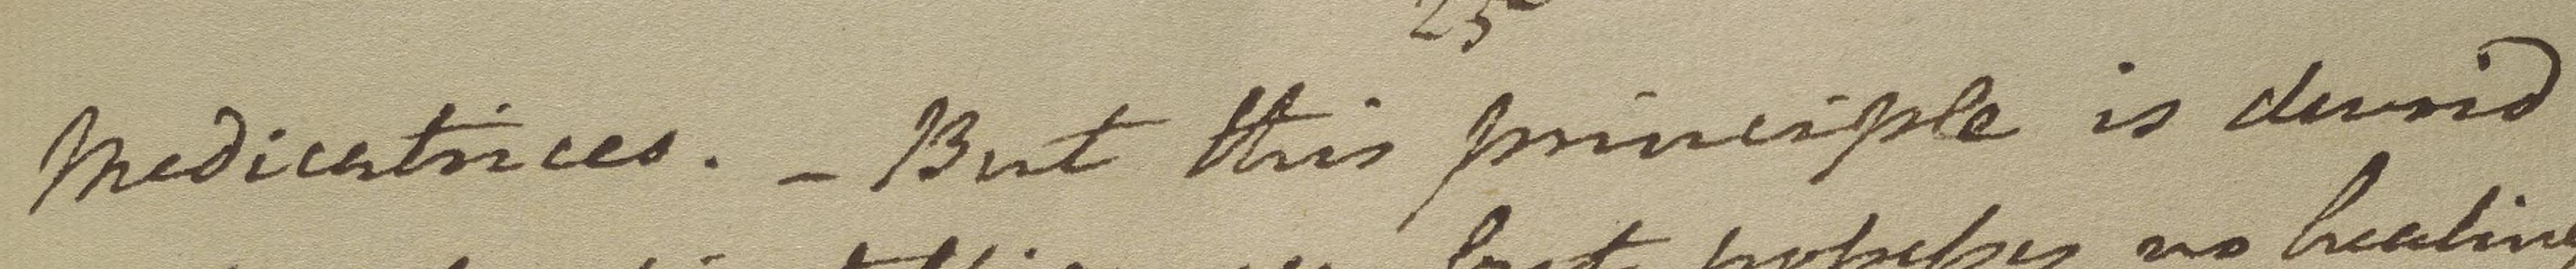medicatrices.- But this principles is devoid
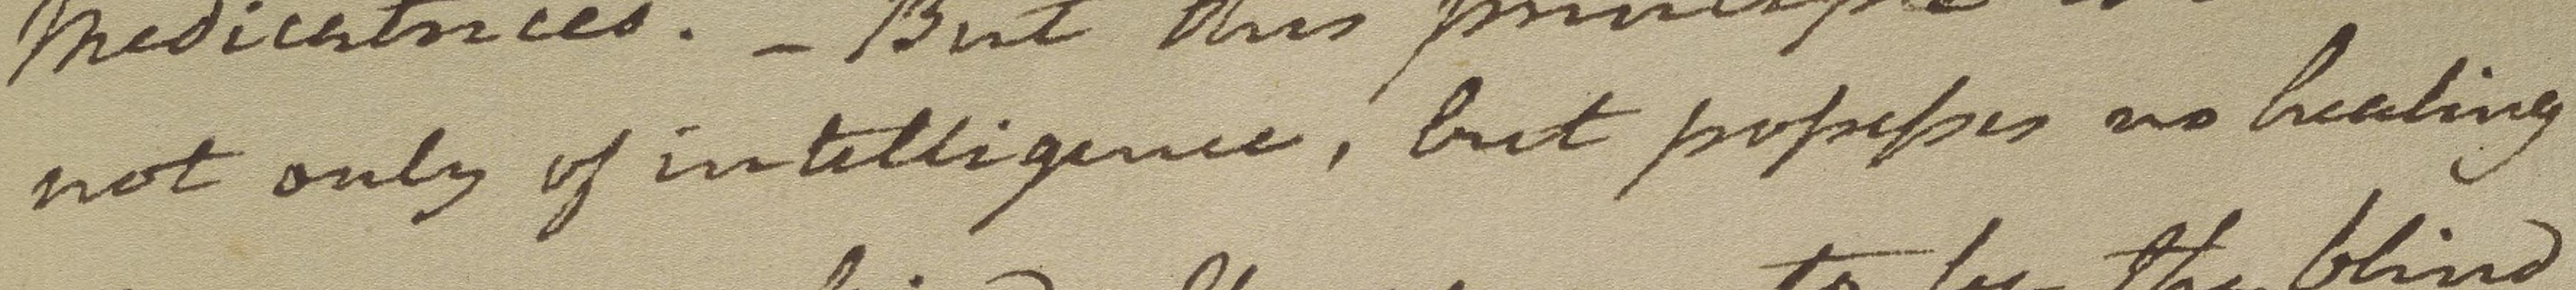not only of intelligence, but proposes no healing
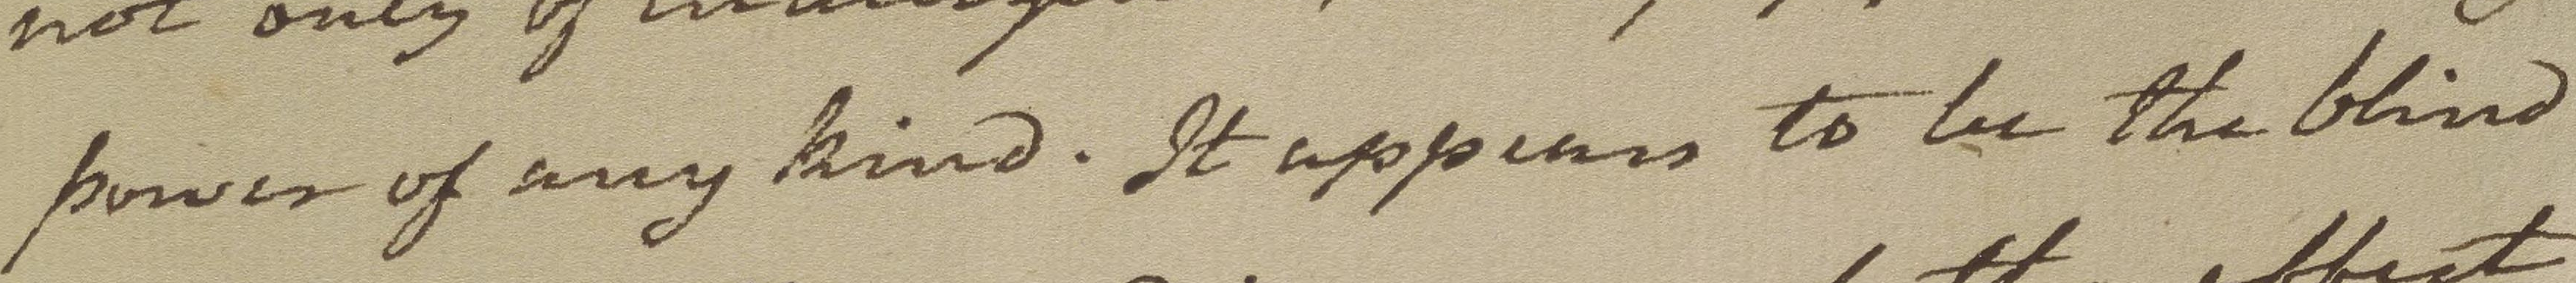power of any kind. It appears to be the blind
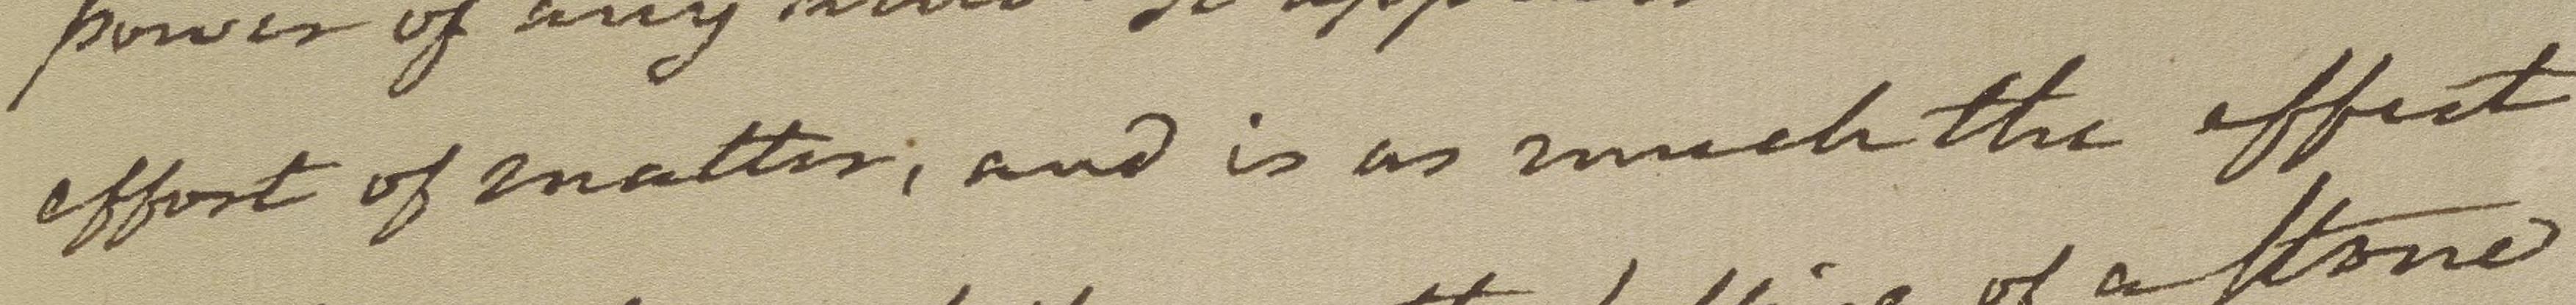effort of matter, and is as much the effect
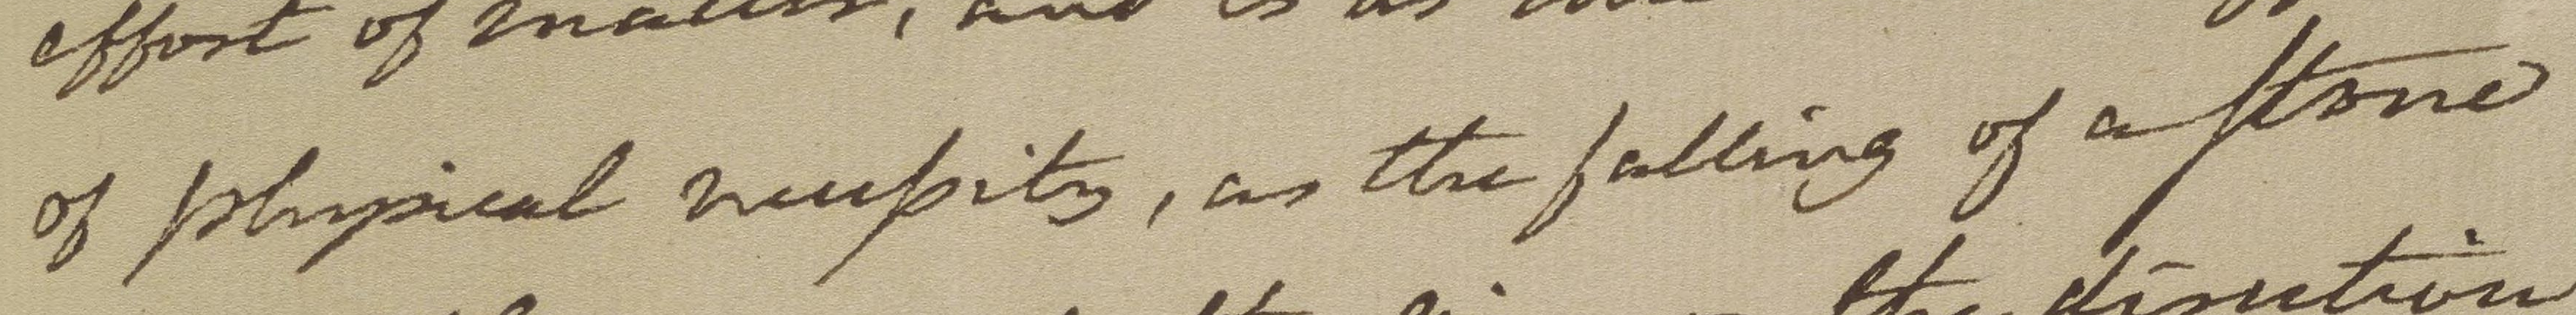of physical necessity, as the falling of a stone
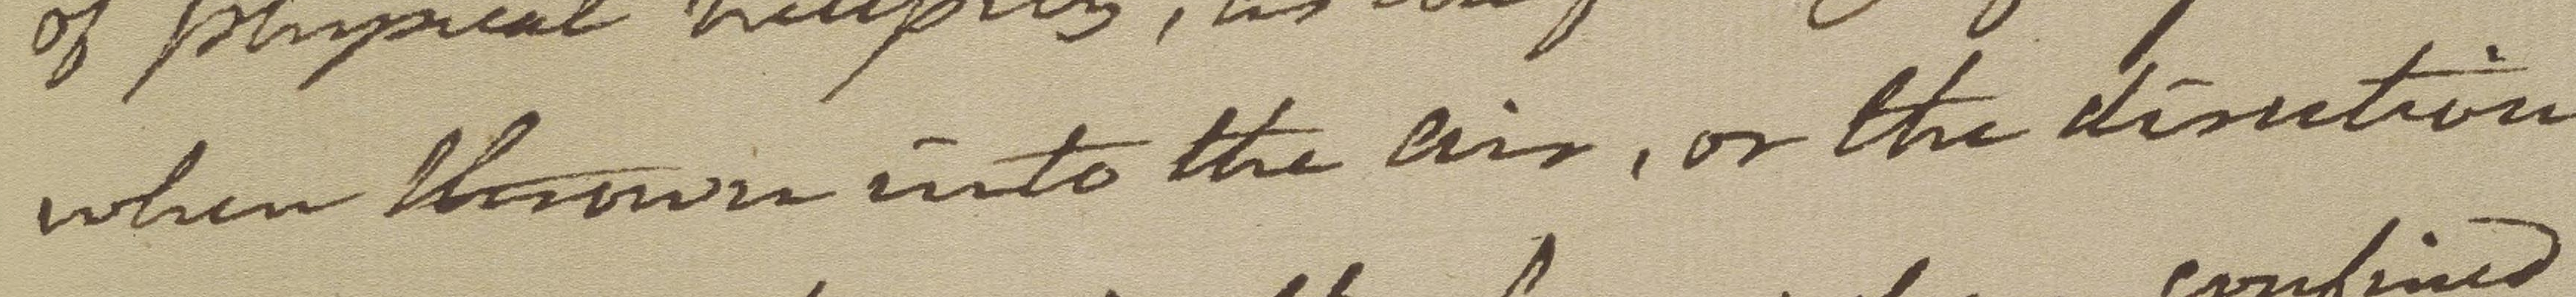when thrown into the air, or the direction
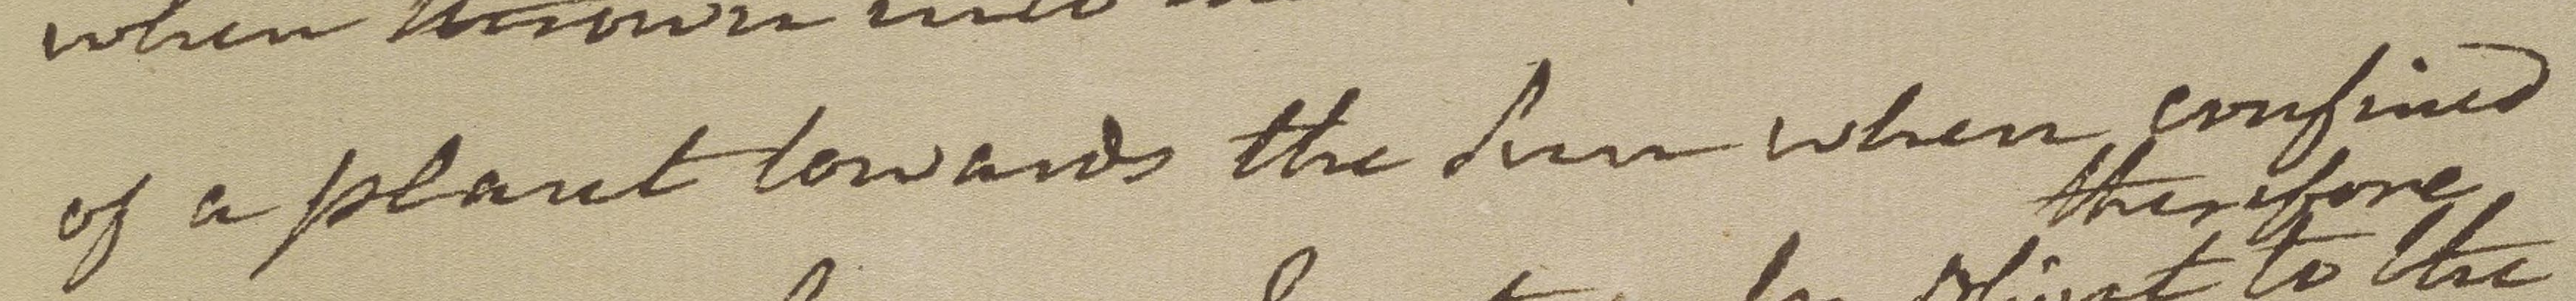of a plant towards the Sun when confined
